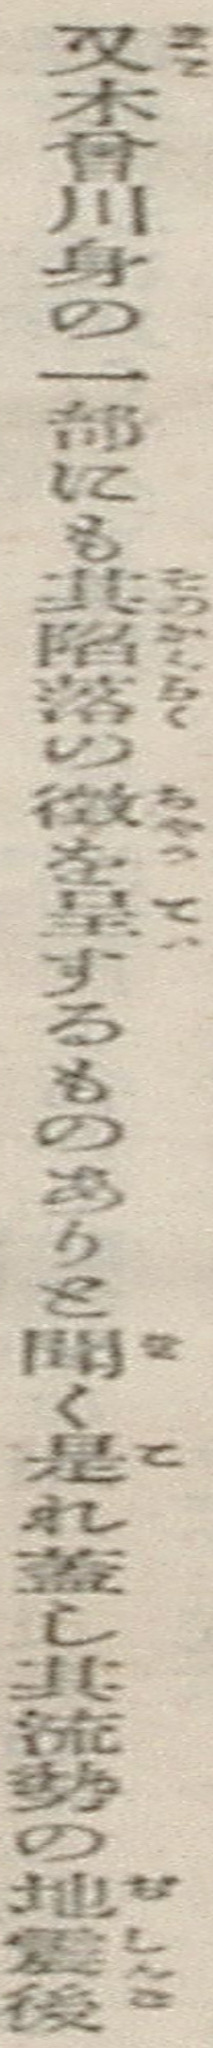又木曽川身の一部にも其陥落の徴を呈するものありと聞く是れ蓋し其流勢の地震後
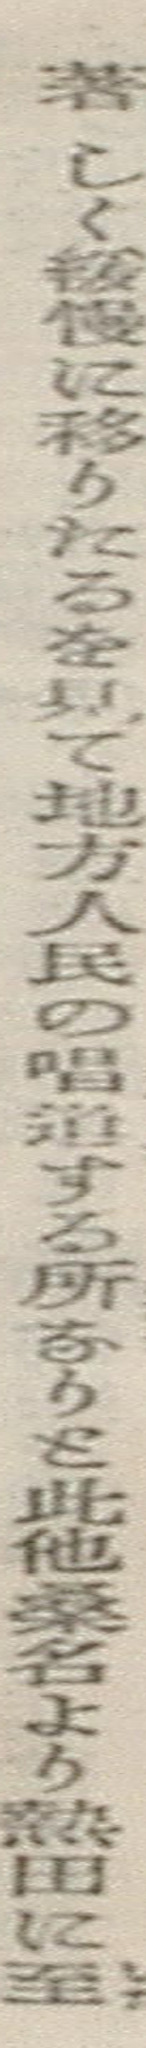著しく緩慢に移りたるを見て地方人民の唱道する所なりと此他桑名より熱田に至
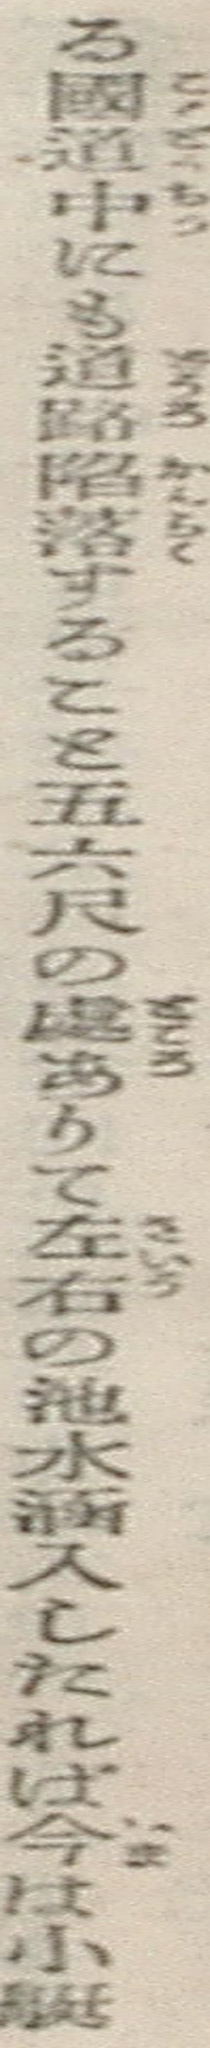る国道中にも道路陥落すること五六尺の処ありて左右の池水涵入したれば今は小艇
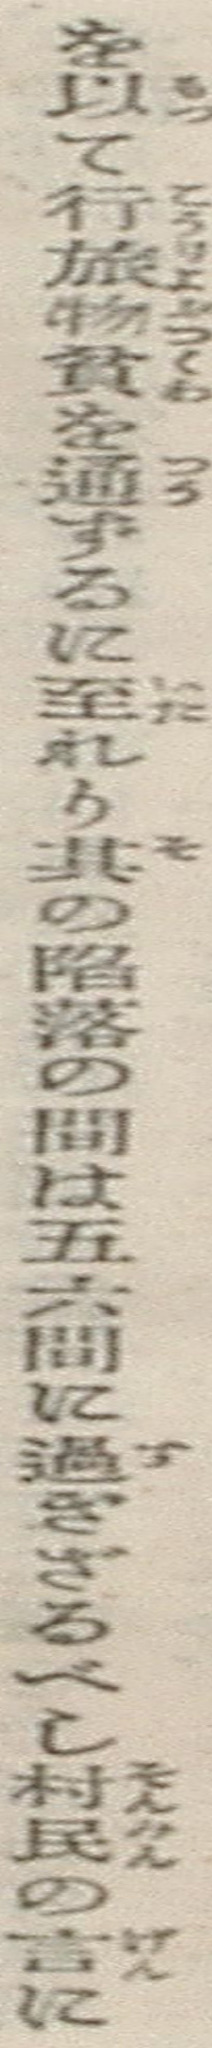を以て行旅物貧を通ずるに至れり其の陥落の間は五六間に過ぎざるべし村民の言に
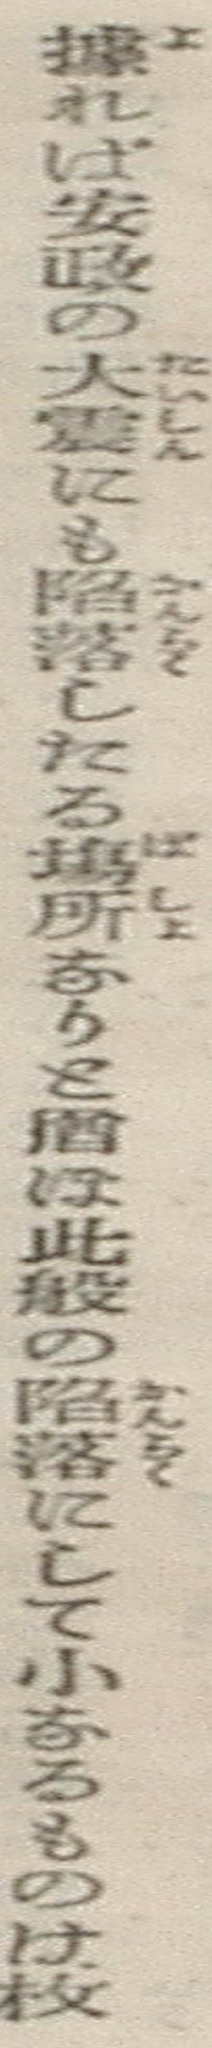據れば安政の大震にも陥落したる場所なりと猶ほ此般の陥落にして小なるものは枚
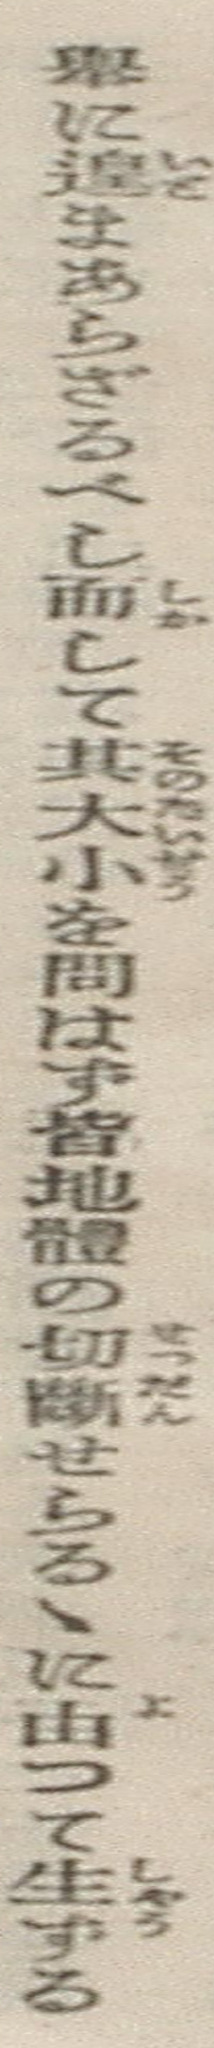挙に遑まあらざるべし而して其大小を問はず皆地体の切断せらるゝに由つて生ずる
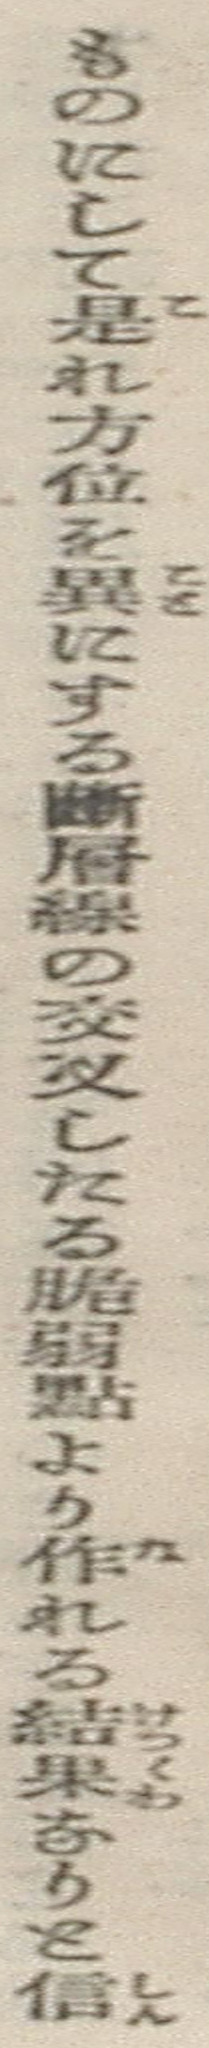ものにして是れ方位を異にする断層線の交叉したる脆弱点より作れる結果なりと信
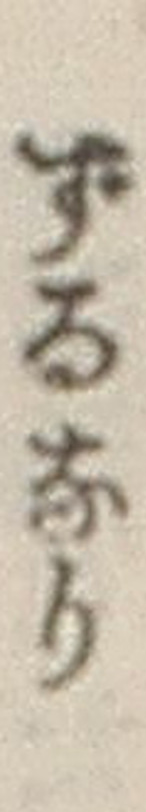ずるなり
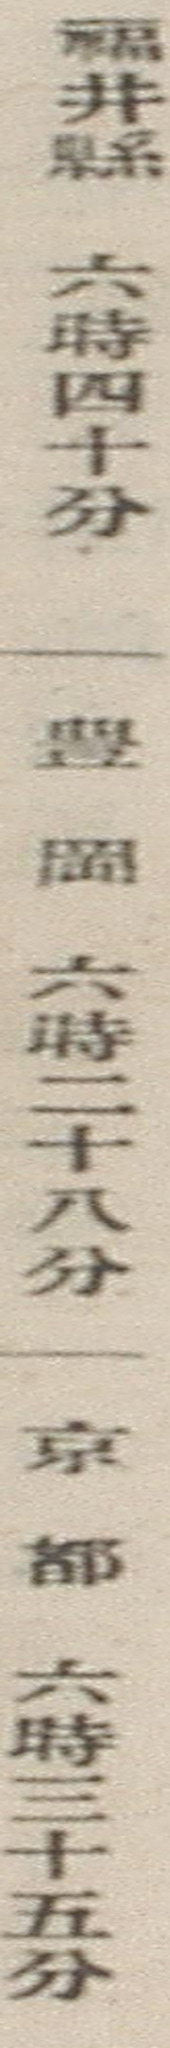福井県六時四十分豊岡六時二十八分京都六時三十五分
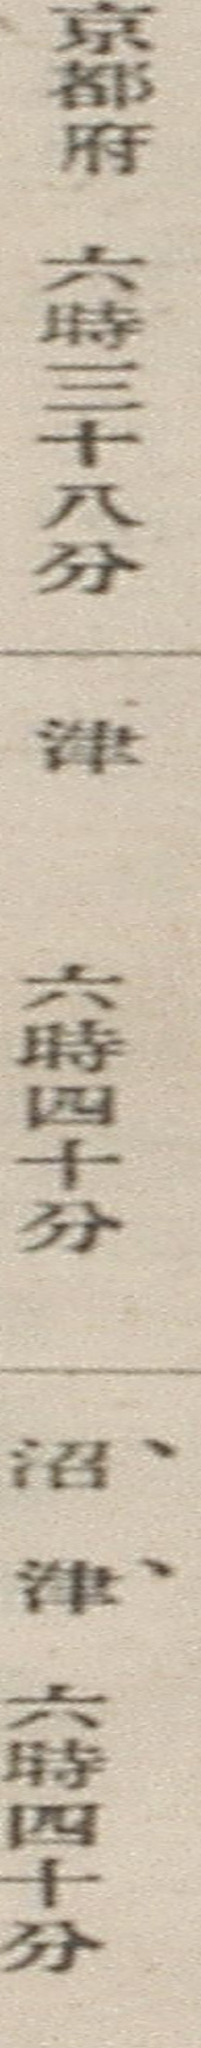京都府六時三十八分津六時四十分沼津六時四十分
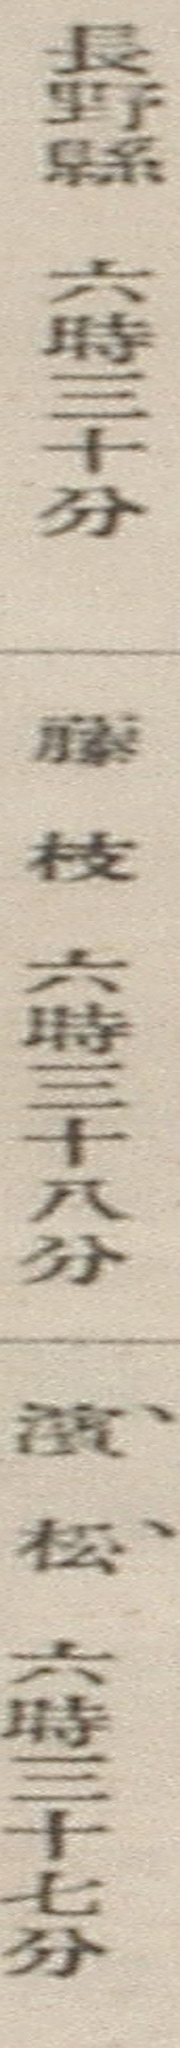長野県六時三十分藤枝六時三十八分浜松六時三十七分
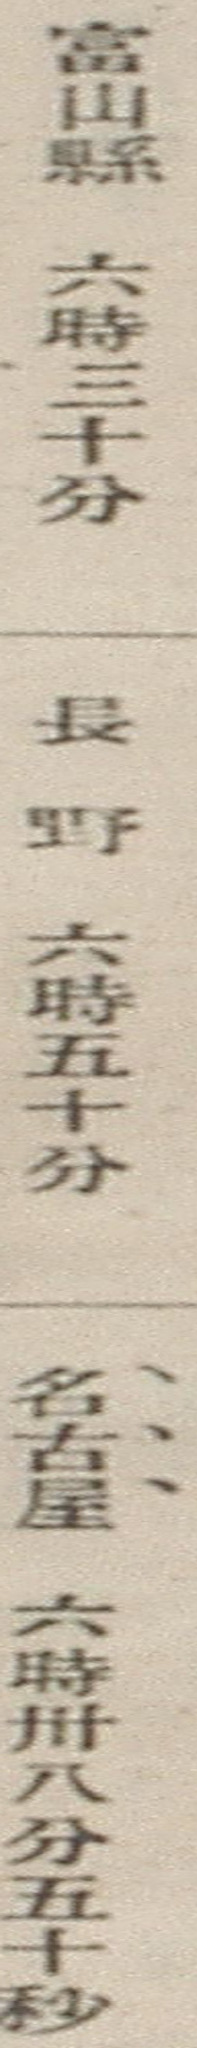富山県六時三十分長野六時五十分名古屋六時卅八分五十秒
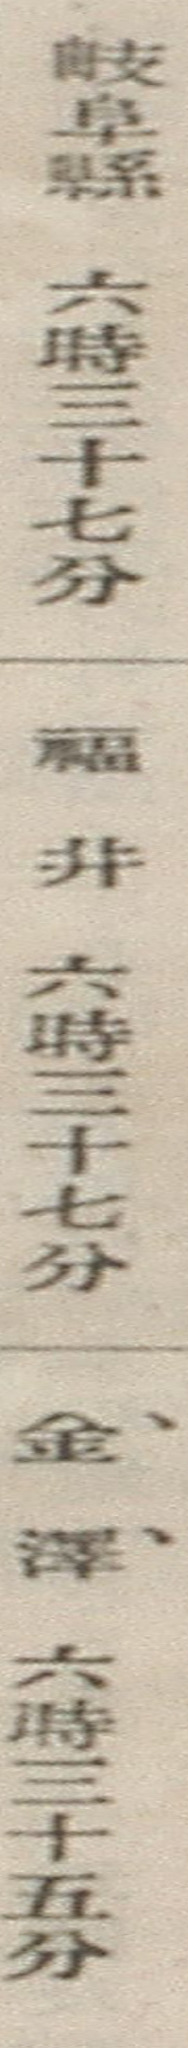岐阜県六時三十七分福井六時三十七分金沢六時三十五分
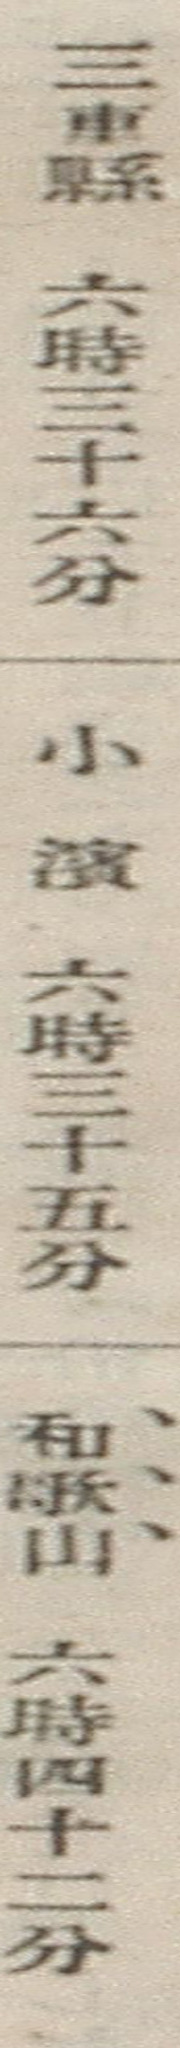三重県六時三十六分小浜六時三十五分和歌山六時四十二分
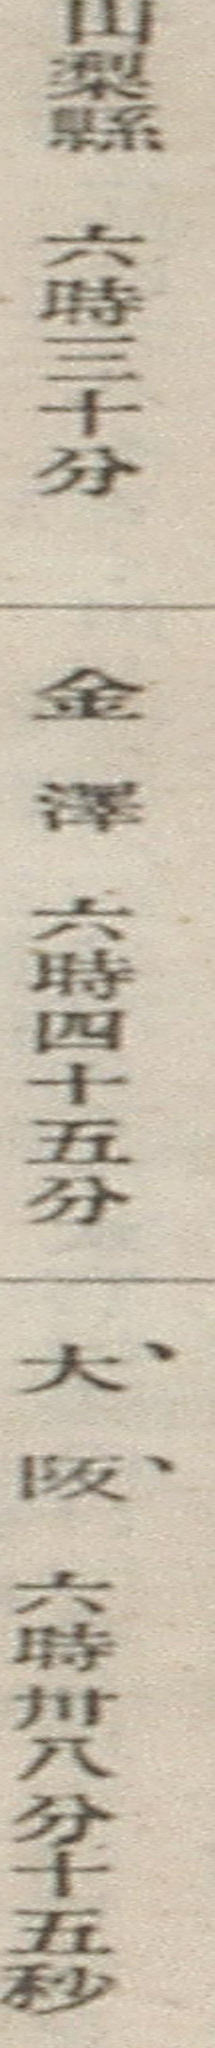山梨県六時三十分金沢六時四十五分大阪六時卅八分十五秒
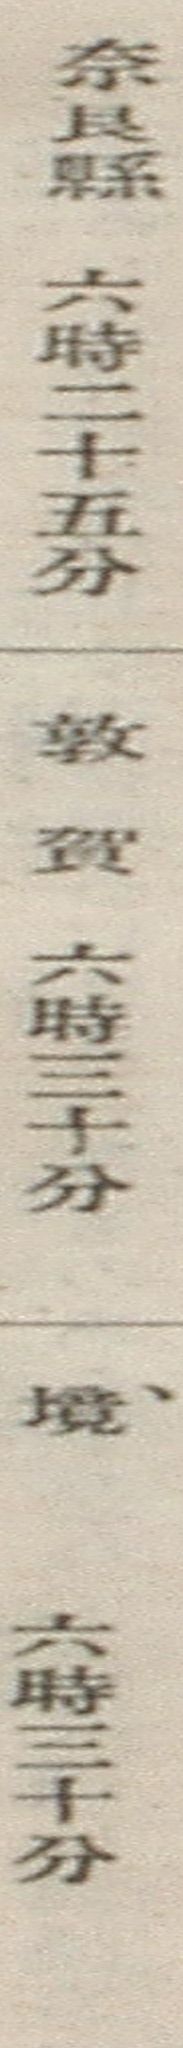奈良県六時二十五分敦賀六時三十分境六時三十分
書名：愛知岐阜福井三県　大地震見聞録（内題）
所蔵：東京大学地震研究所図書室 Earthquake Research Institute Library, The University of Tokyo, JAPAN
